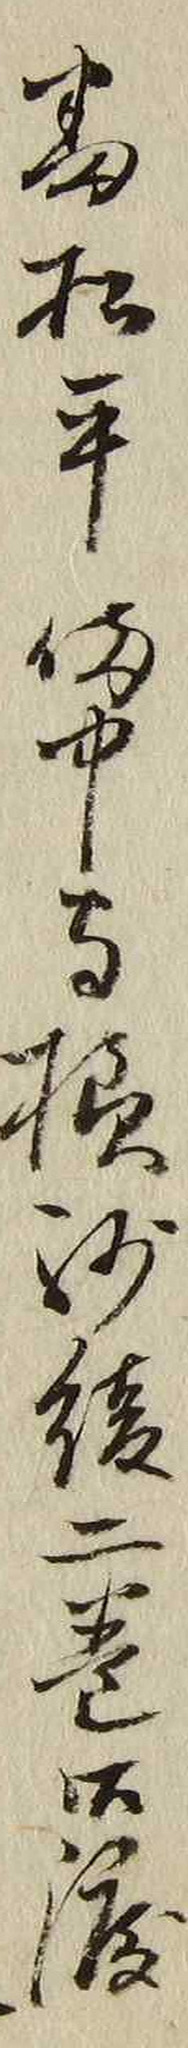番松平備中守様紗綾二巻御渡
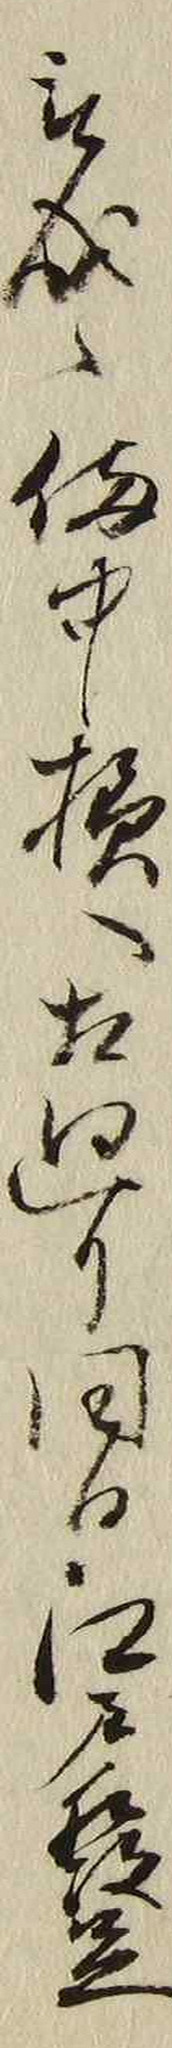被成候備中様へ相廻り同日江戸発足
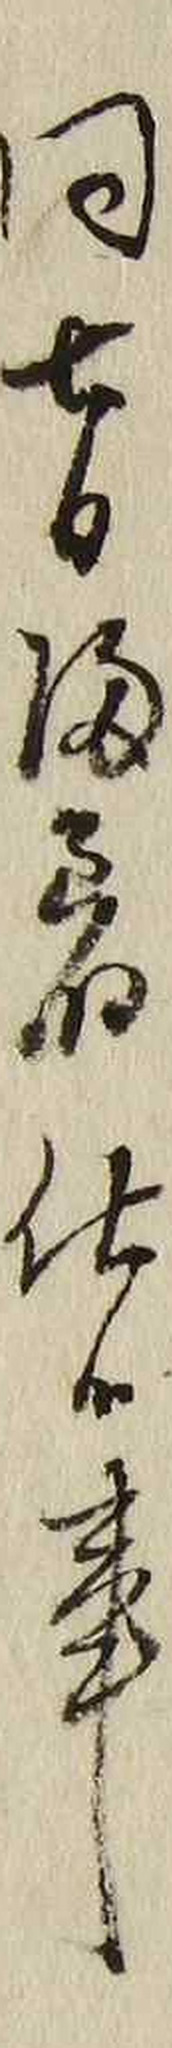同七日帰着仕候事
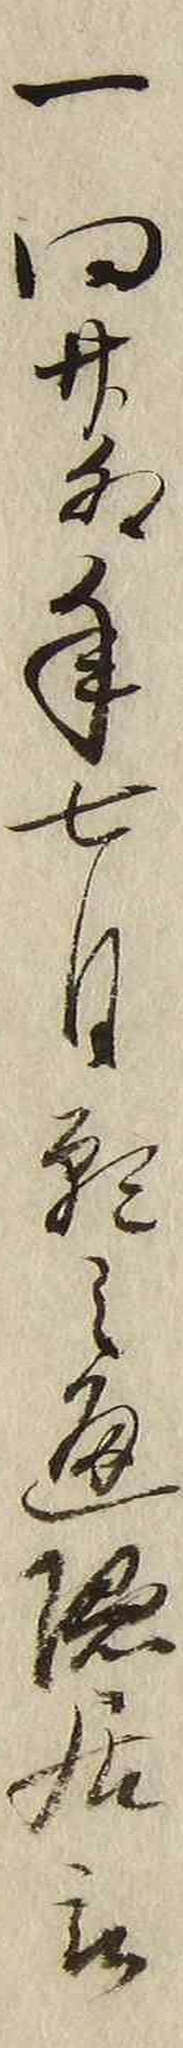一同廿卯年七月願之通隠居被

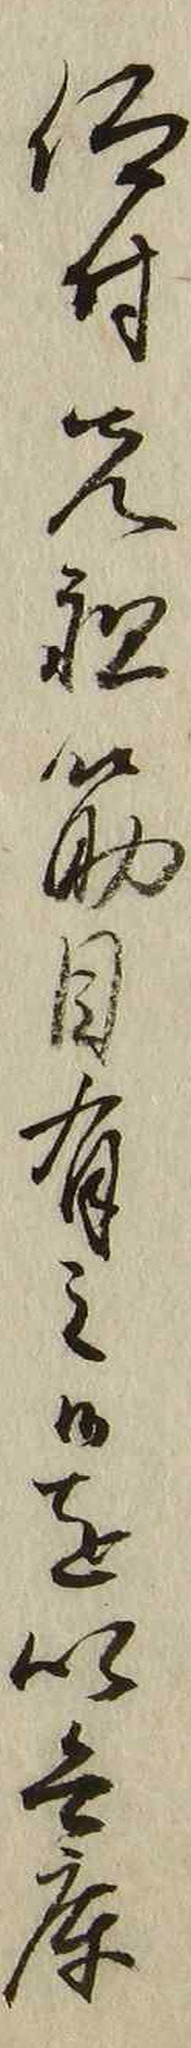仰付先祖筋目有之候を以兵庫
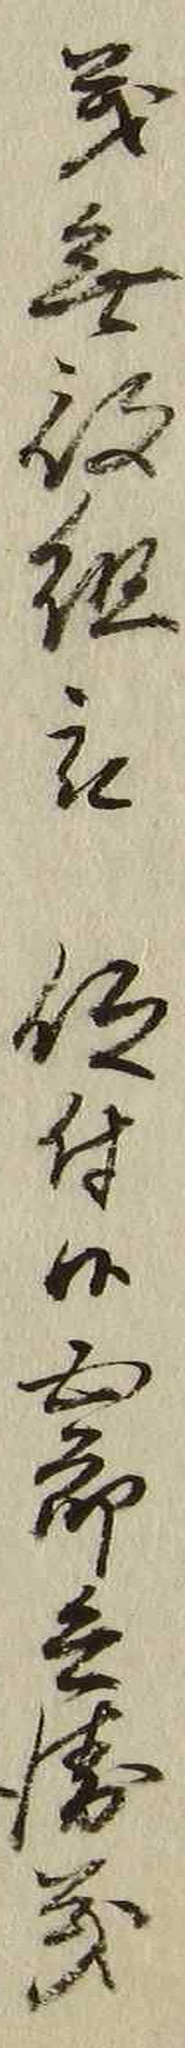義無役組被仰付候五郎兵衛義
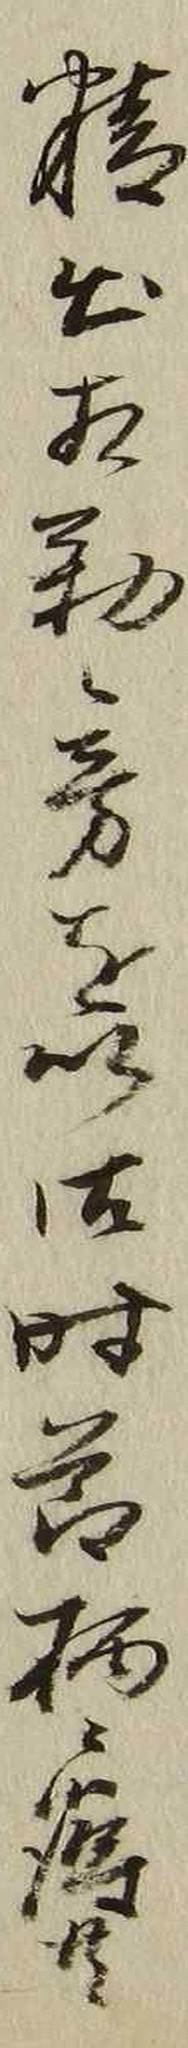精出相勤候旁を以御時節柄ニ候得共
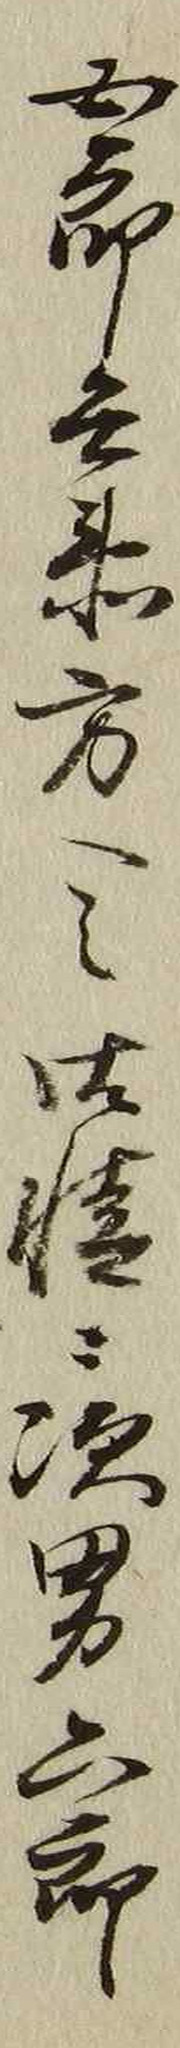五郎兵衛方へ之御情ニ次男六郎
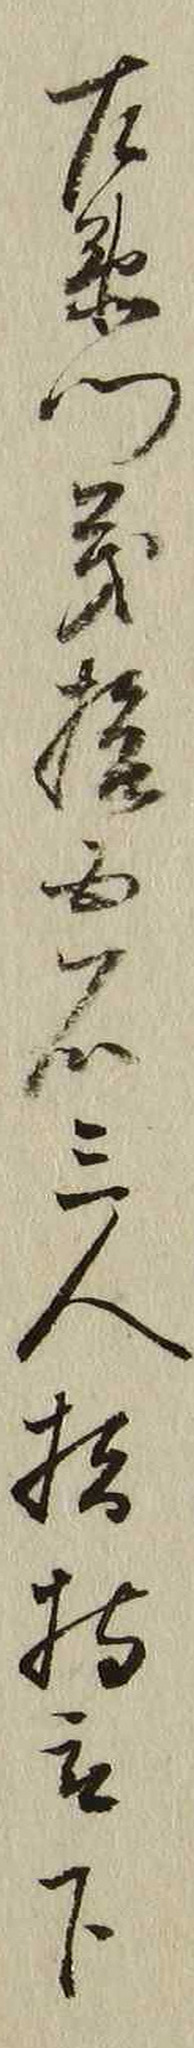左衛門義拾五石三人扶持被下
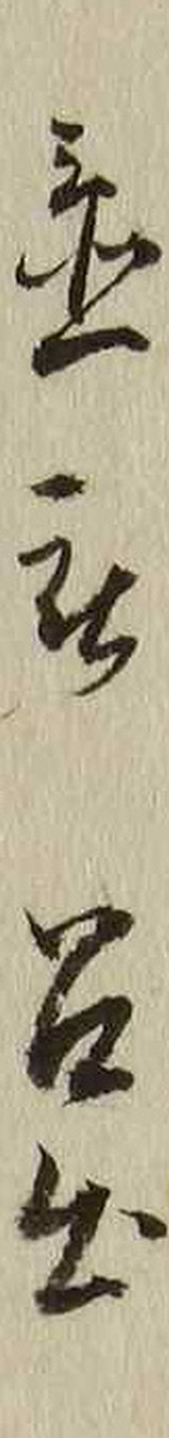置被召出
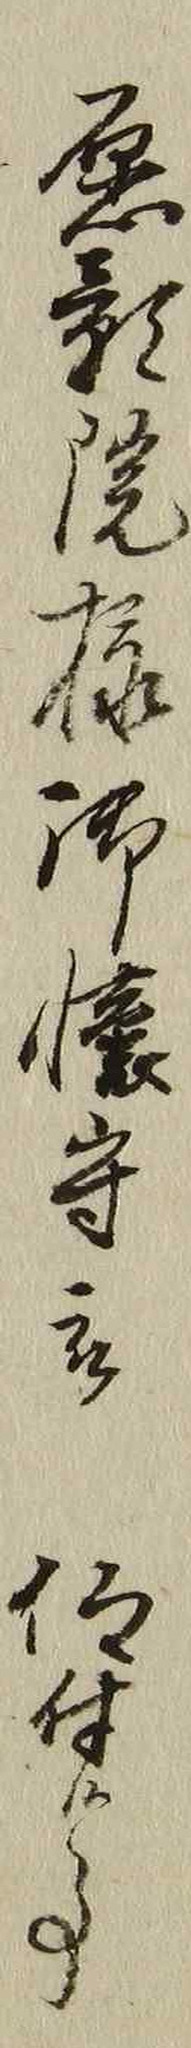愿彰院様御懐守被仰付候事
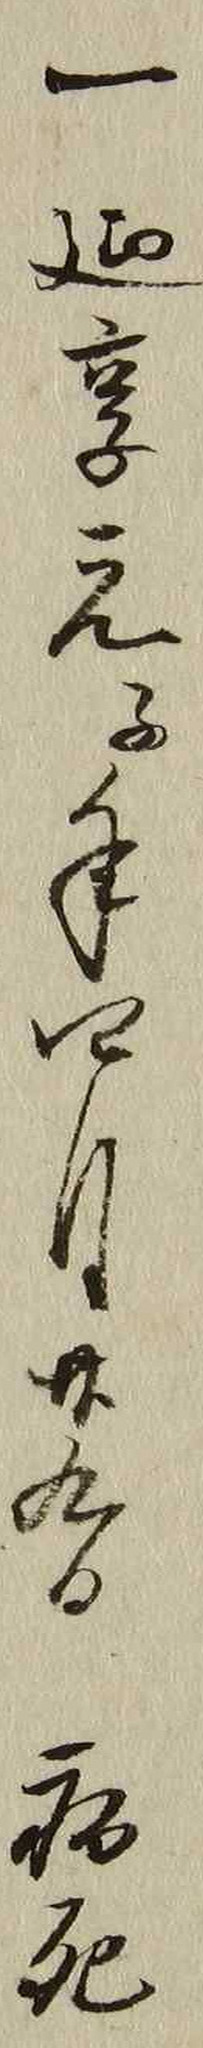一延享元子年四月廿九日病死
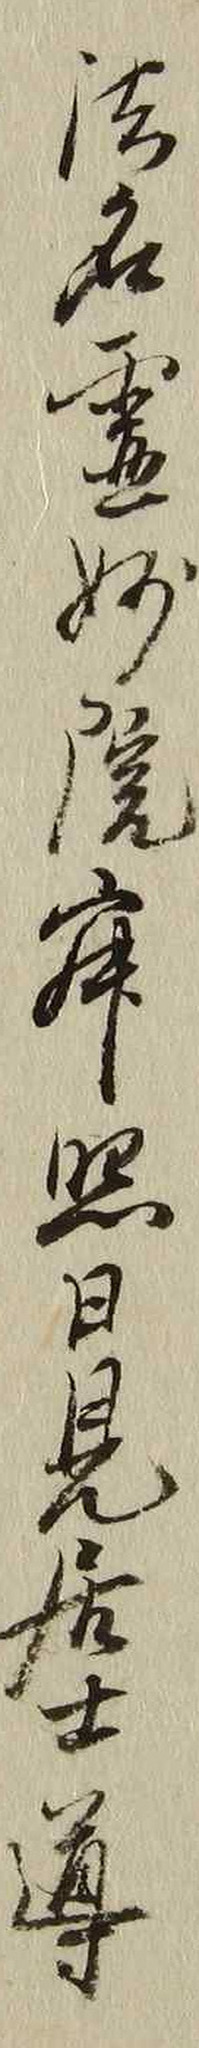法名霊妙院寐照日見居士導
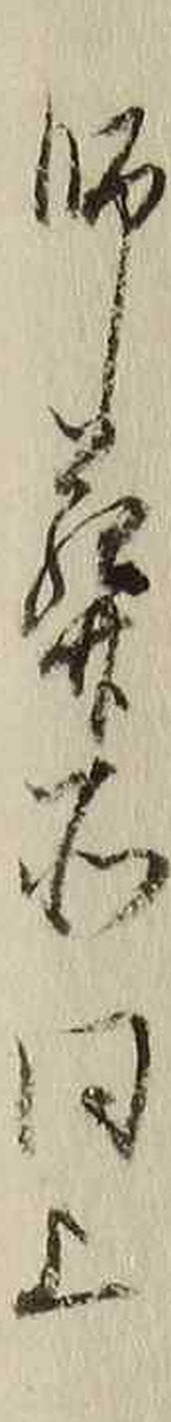師葬所同上
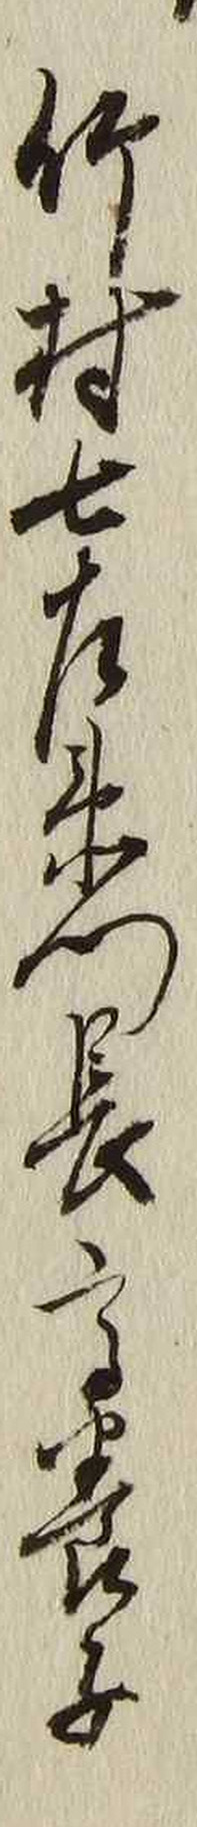竹村七左衛門長高養子
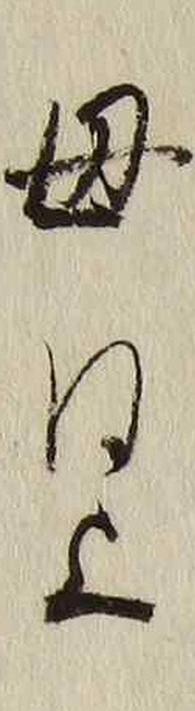母同上
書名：諸士系譜　巻之351　す之部1
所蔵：会津若松市立会津図書館
